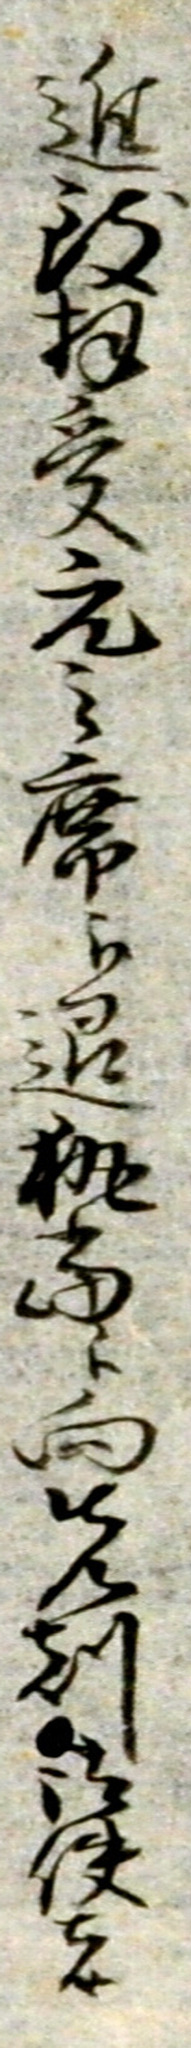進致拝受元之席江退執当江向先刻御使者
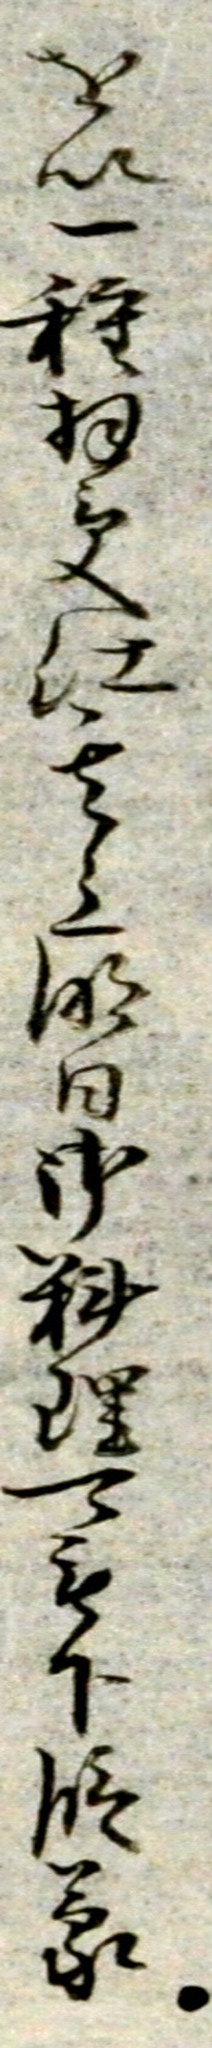を以一種拝受仕其上明日御料理可被下段蒙
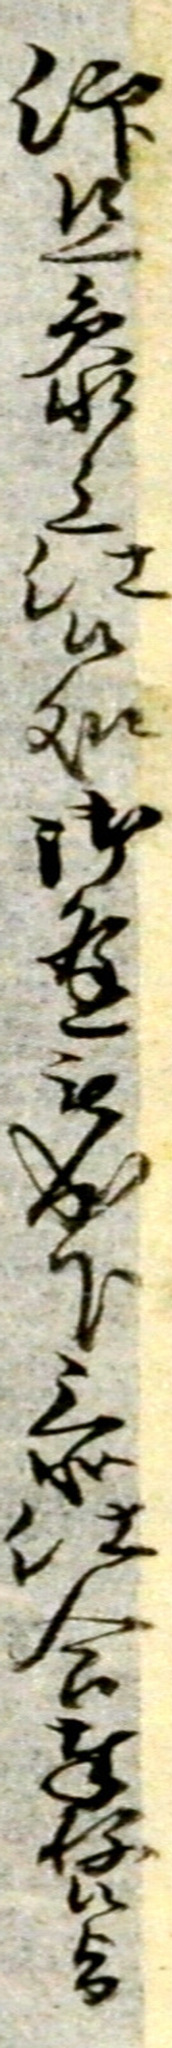仰且参上仕候処御逢被成下忝仕合奉存候旨
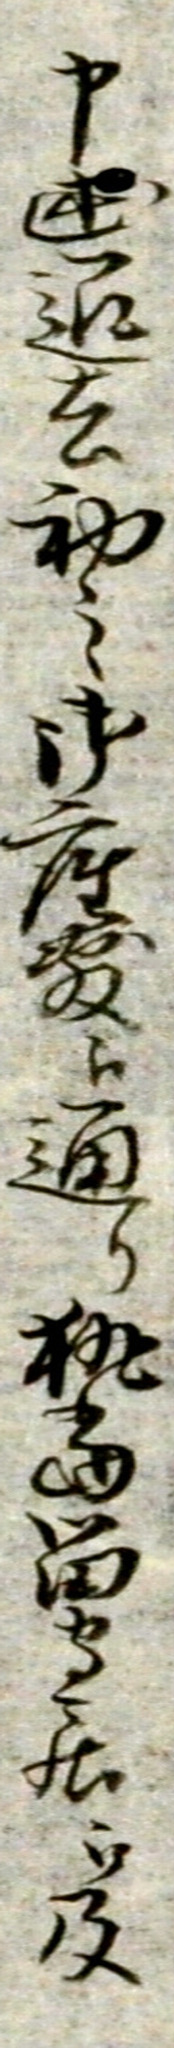申述退去初之御座敷江通り執当留守居江及
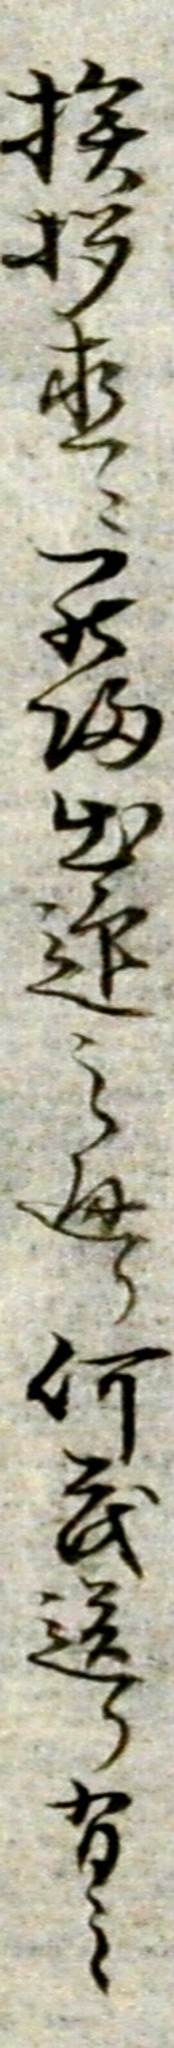挨拶直二罷帰出迎之通り何も送り有之
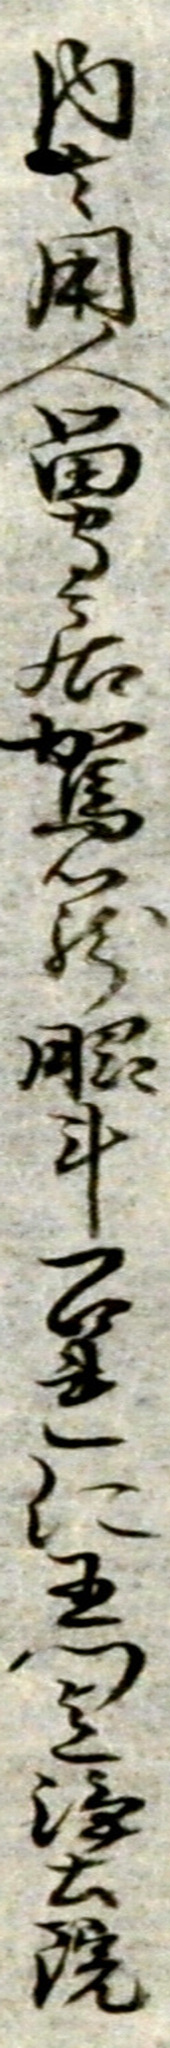内者用人留守居駕籠脇斗召連仁王門迠浄土院
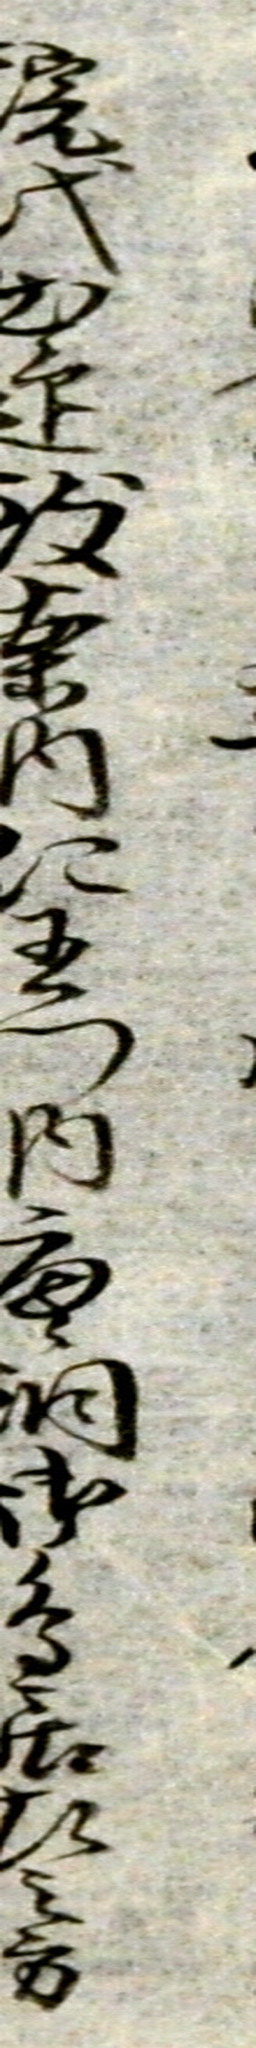院代出迎致案内仁王門唐銅御鳥居左之方

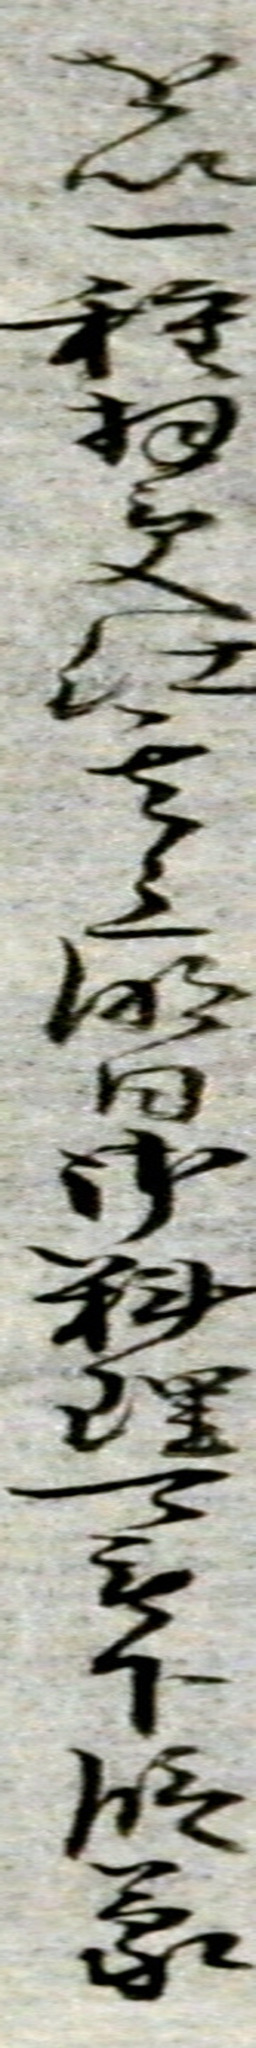を以一程拝受仕其上明日御料理可被下段蒙
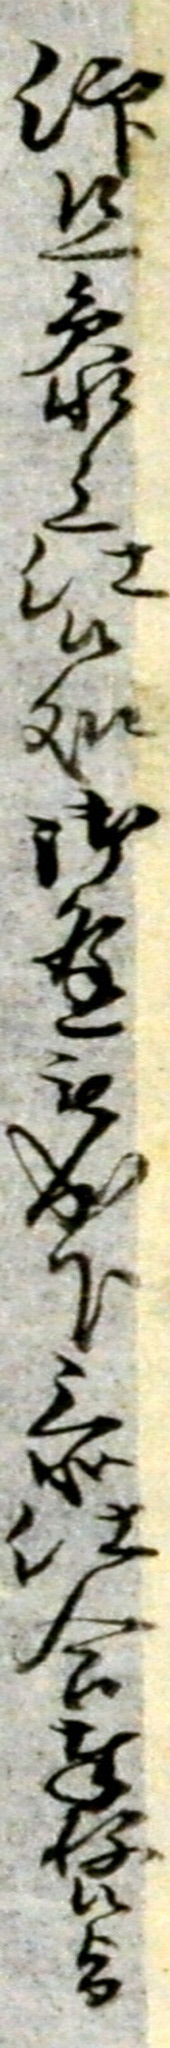仰且参上仕候処御逢被成下忝仕合奉存候旨
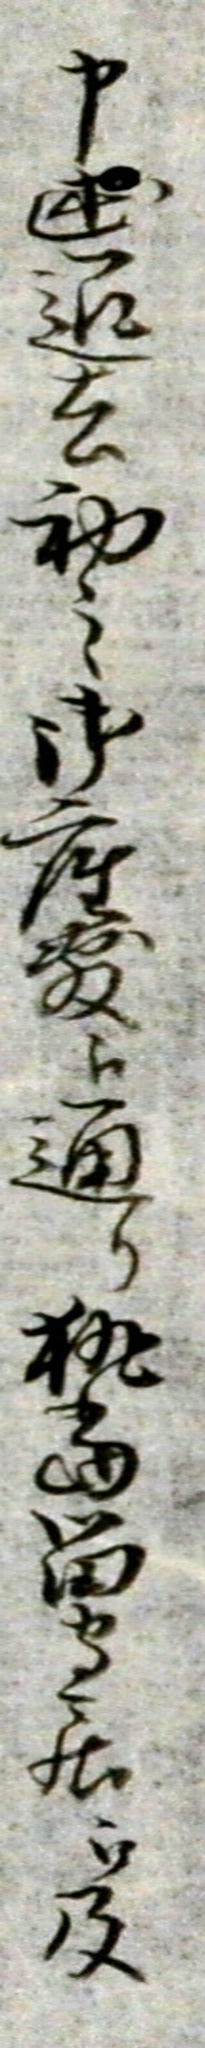申述退去初之御座敷江通り執當留守居江及
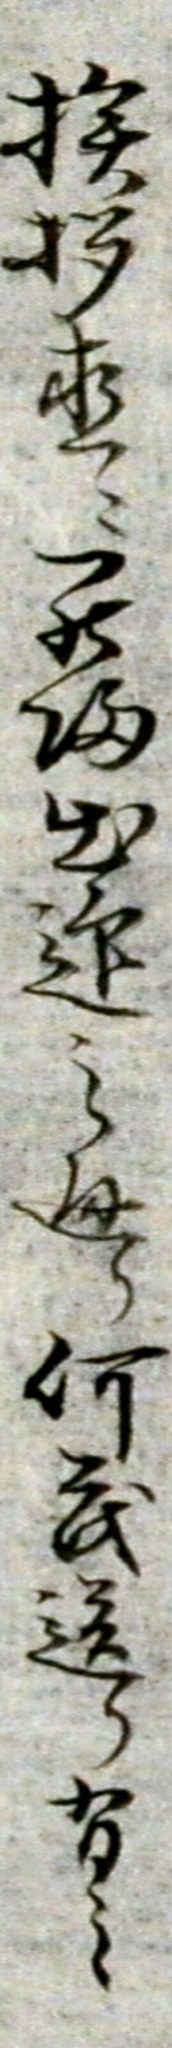挨拶直ニ罷帰出迎之通り何茂送り有之
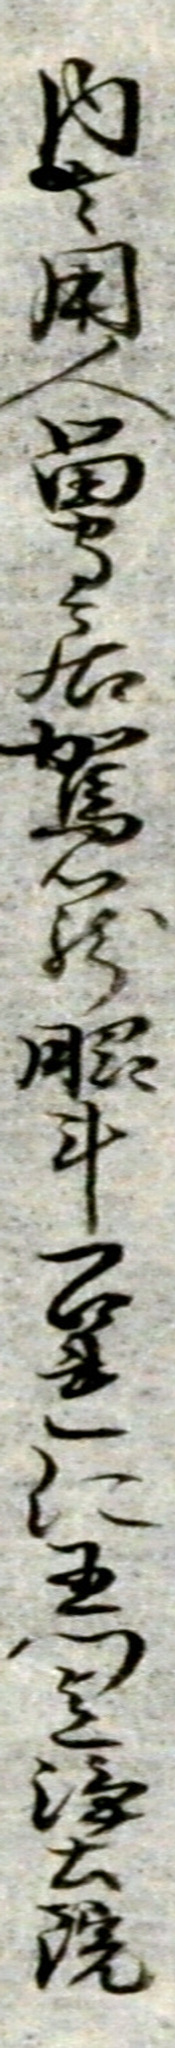内者用人留守居駕籠脇計召連仁王門迄浄土院
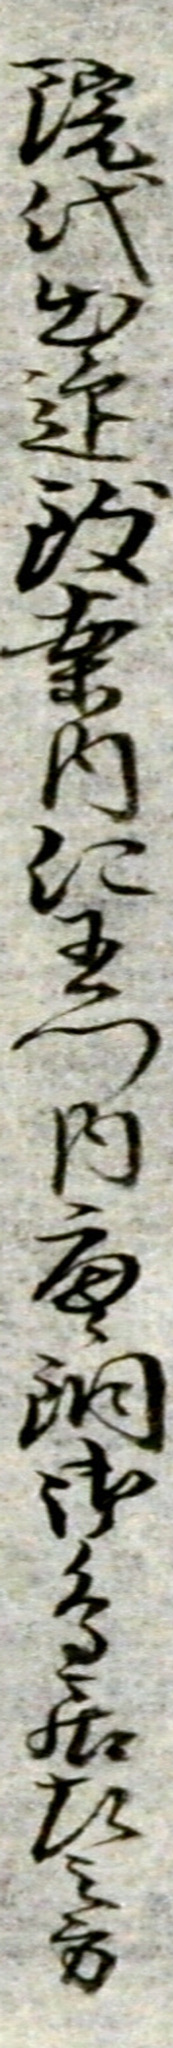院代出迎致案内仁王門内唐銅御鳥居左之方
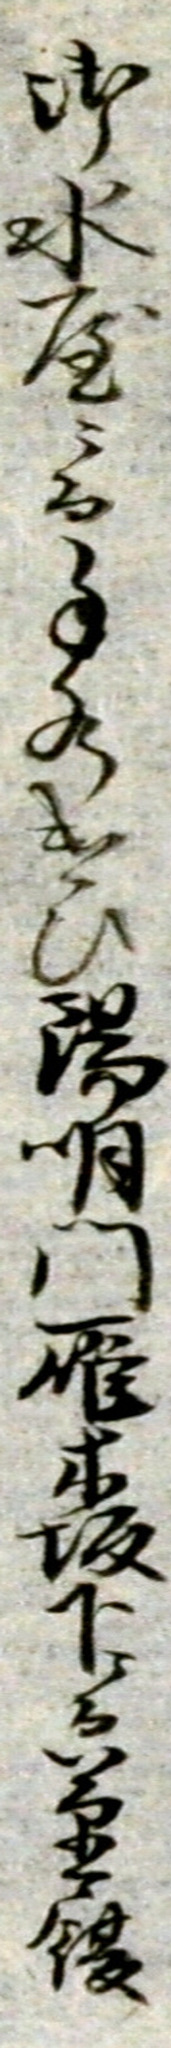御水屋ニ而手水遣ひ陽明門雁木坂下ニ而草履
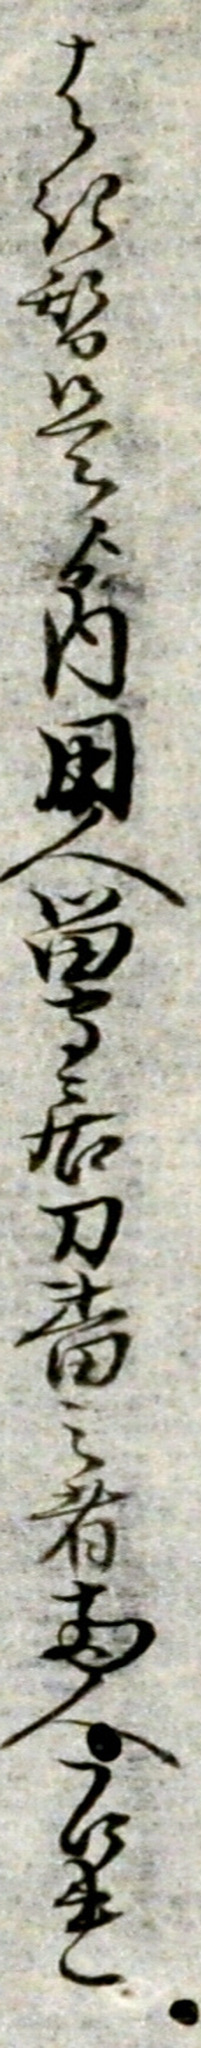はき替是ゟ内用人留守居刀番之者両人召連
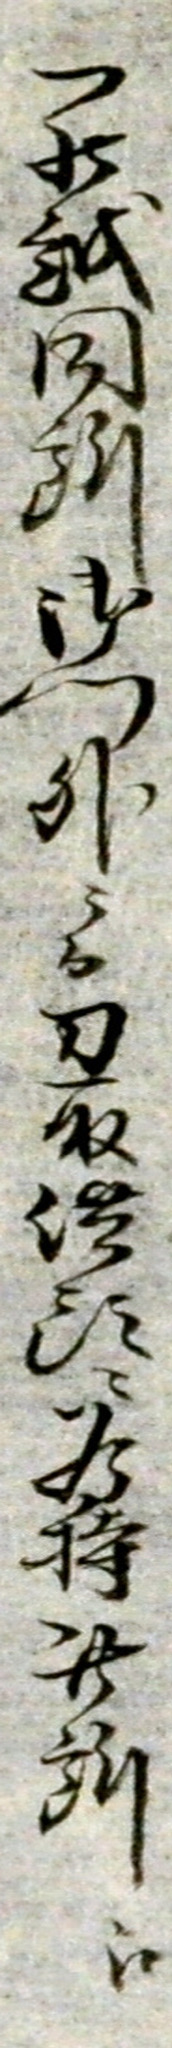罷越同所御門外ニ而刀取供頭ニ為持此所江
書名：日光御名代相勤候節ノ留
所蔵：伊那市立高遠町図書館・合同会社AMANE
